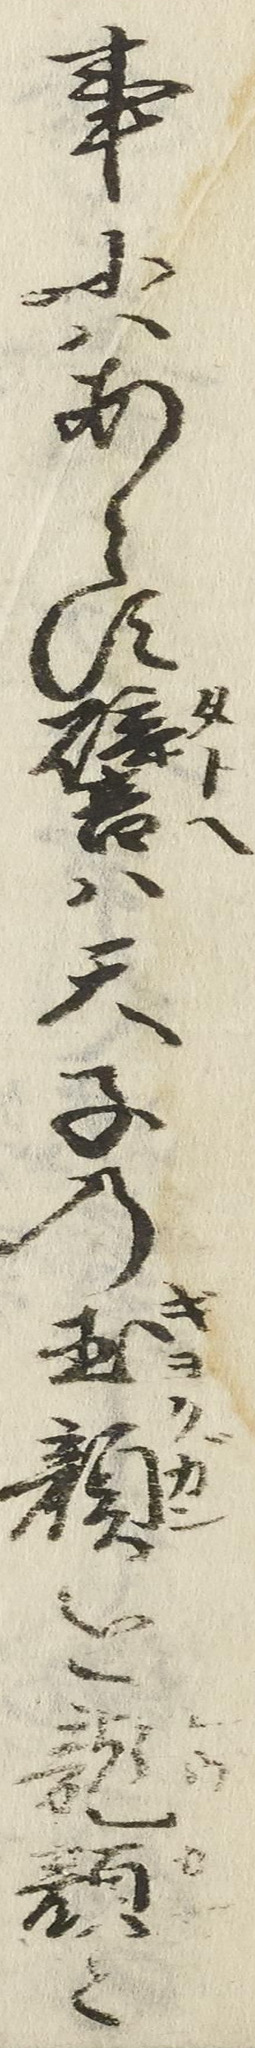事にはあらす譬は天子の玉顔を龍顔と
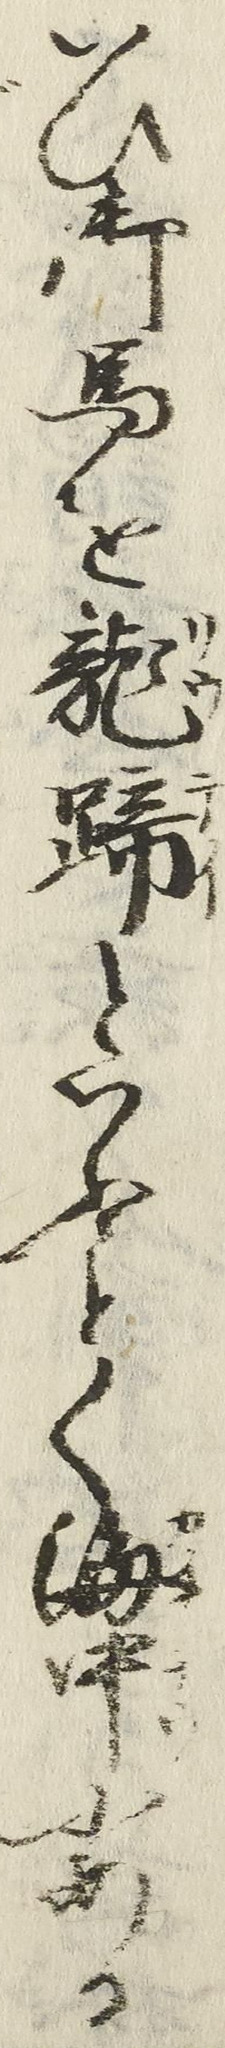いひ御馬を龍蹄といふことく海中にある
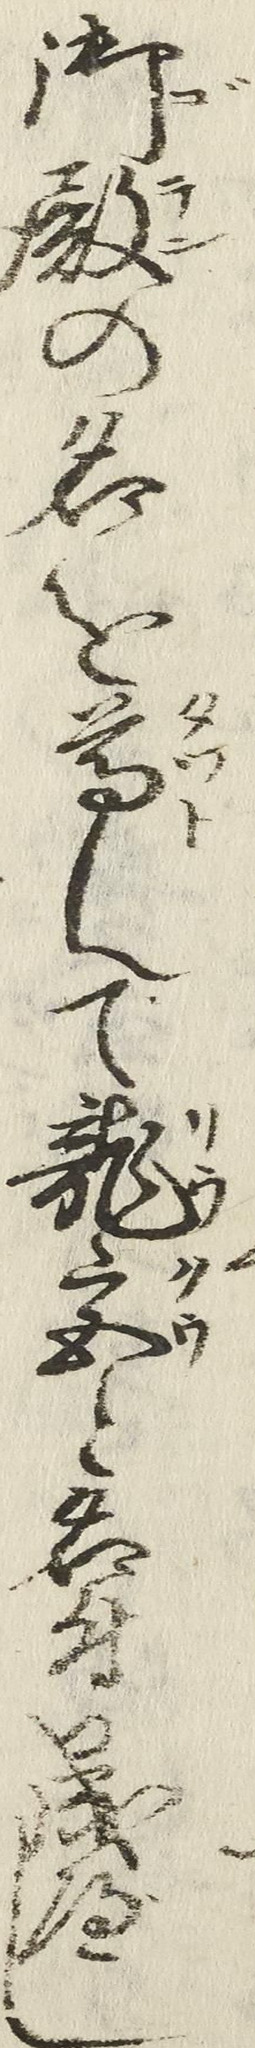御殿の名を尊んて龍宮と名付る成へし
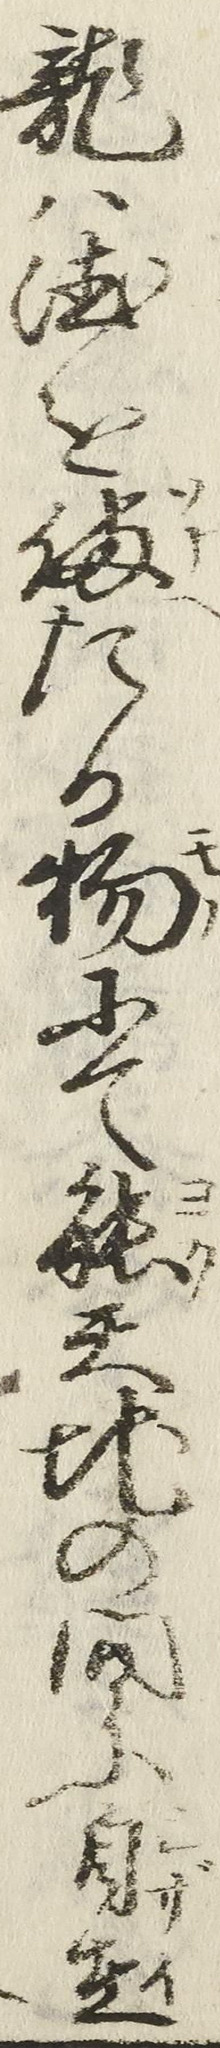龍は徳を備たる物にて能天地の間に自在
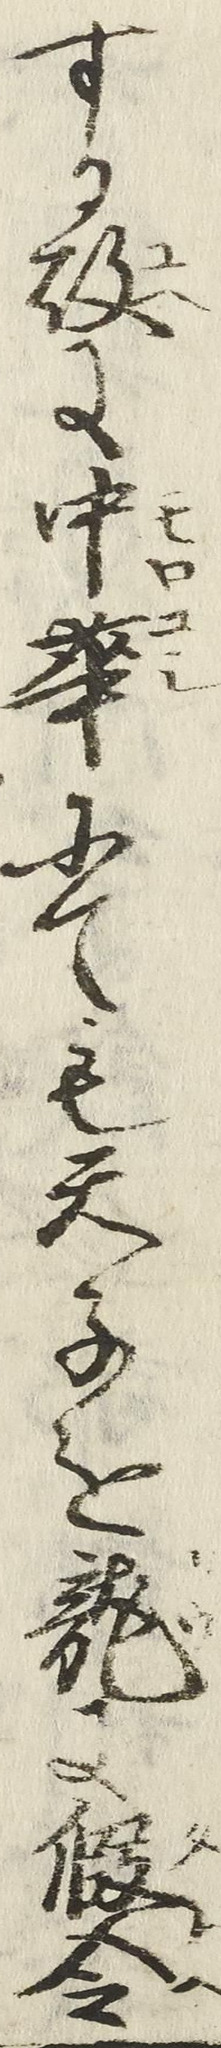する故に中華にても天子を龍に仮令
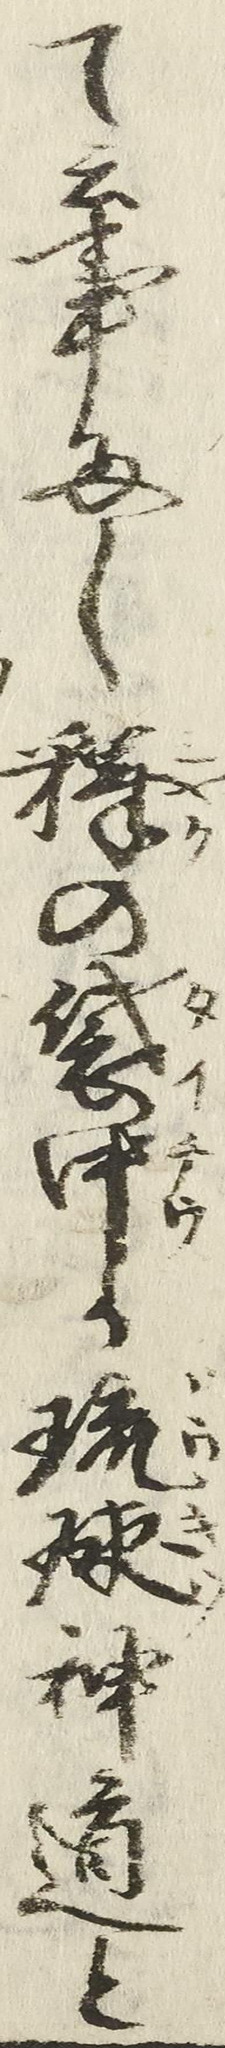て云事多し釈の袋中より琉球神道と
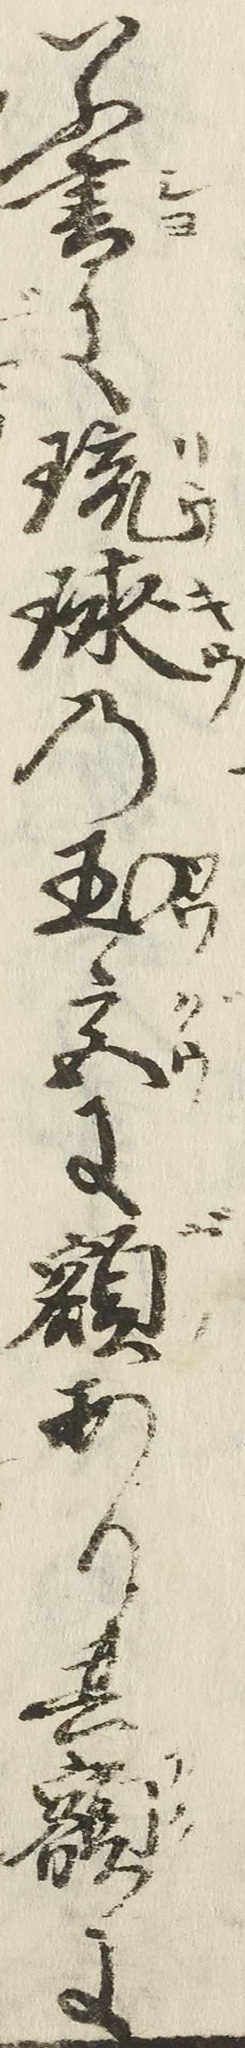いふ書に琉球の王宮に額あり其額に
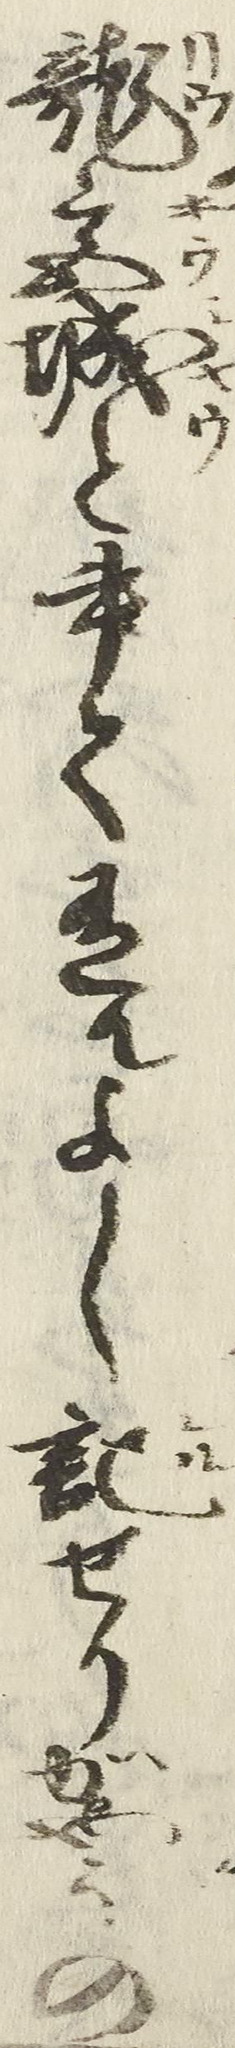龍宮城と書て有ルよし記せりかやうの
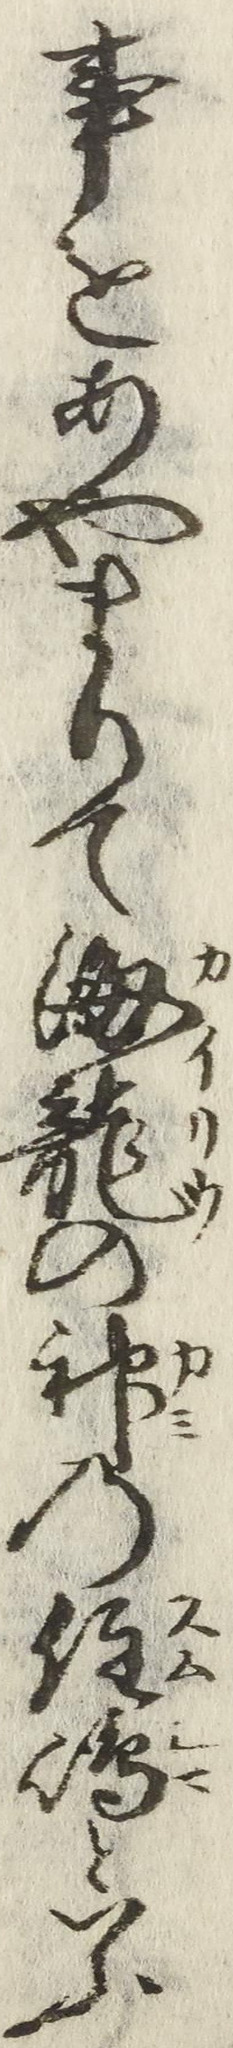事をあやまりて海龍の神の住嶋といふ
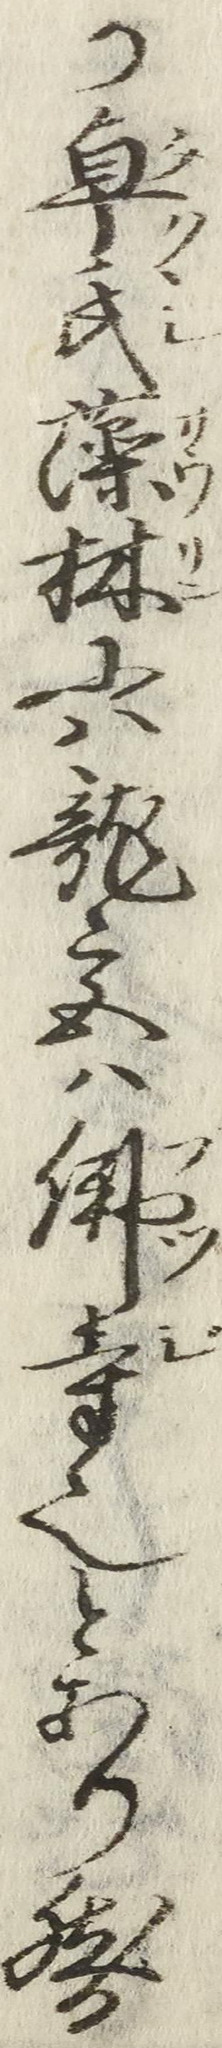か卓氏藻林には龍宮は佛寺也とあり然る
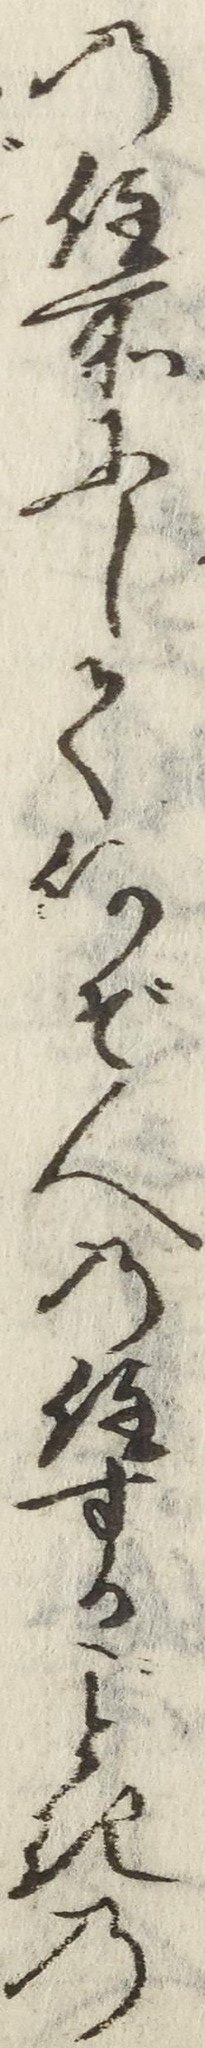の住所にして何ぞ人の住することきの
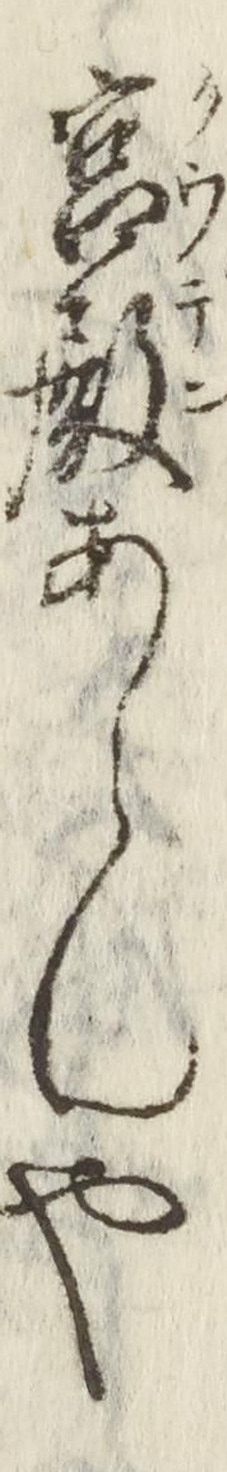宮殿あらんや
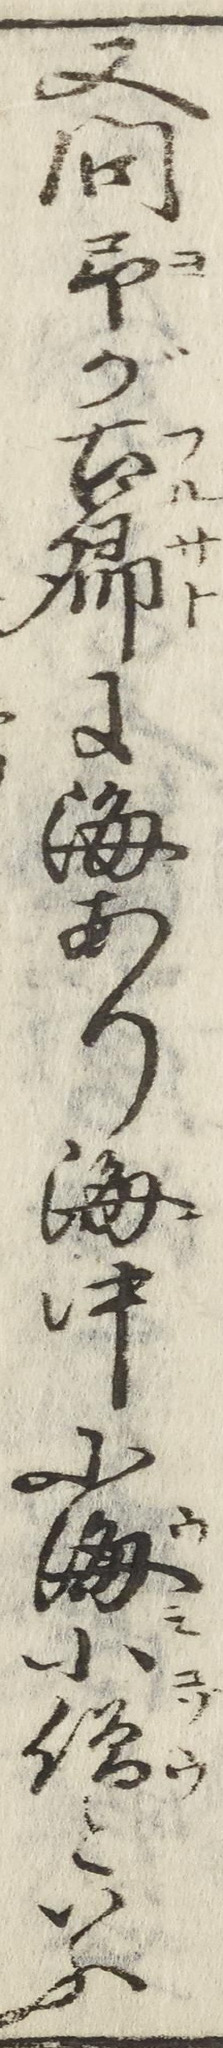又問予が古郷に海あり海中に海小僧といふ
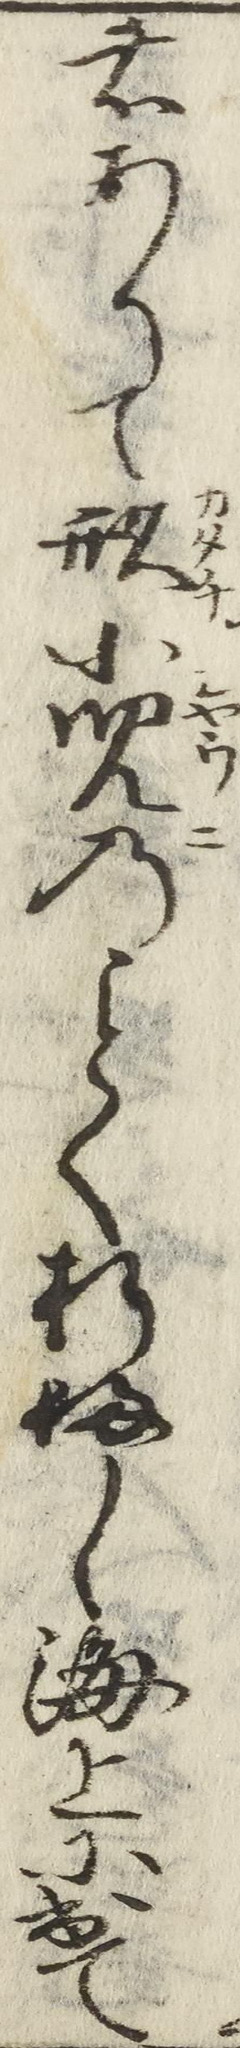者ありて形小児のことく折ふし海上に出て

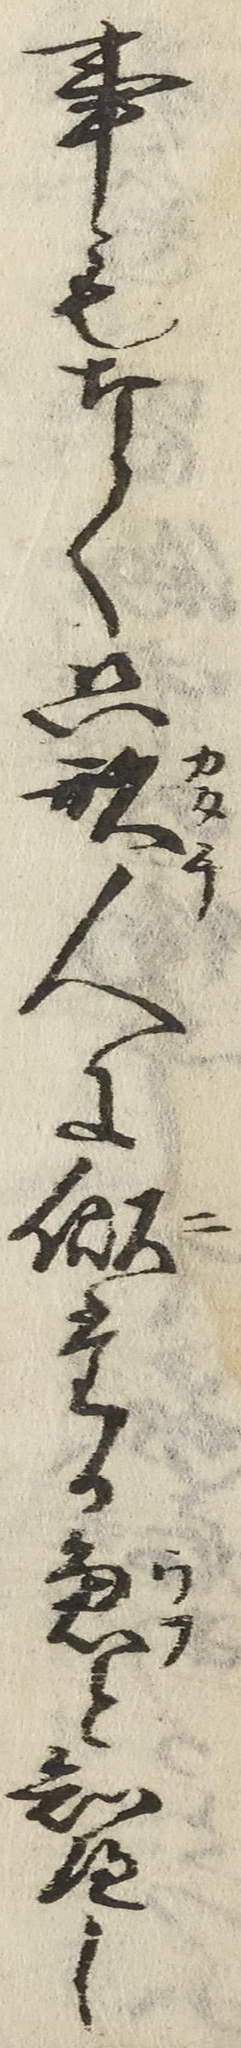事もなく只形人に似たる魚を知へし
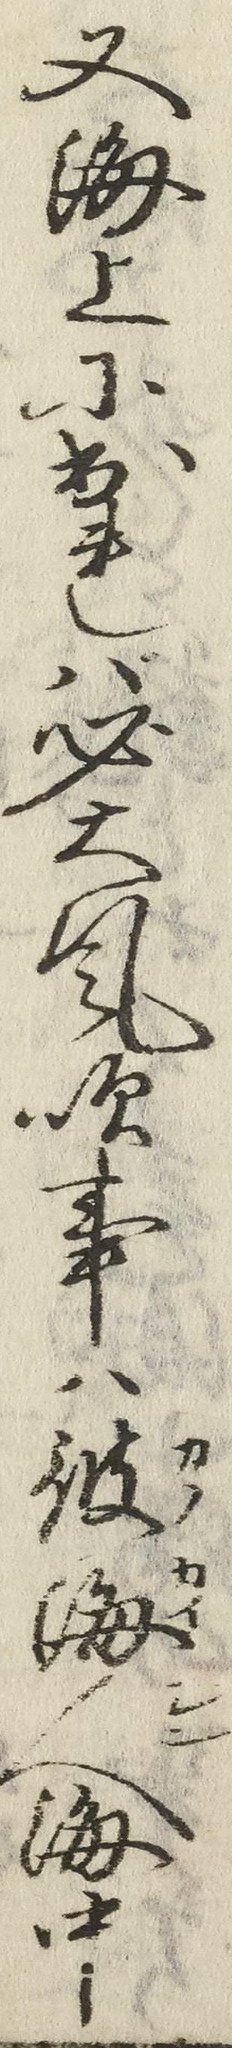又海上に出れば必大風吹事は彼海人海中
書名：天地或問珍　天
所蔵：東京大学地震研究所図書室 Earthquake Research Institute Library, The University of Tokyo, JAPAN
